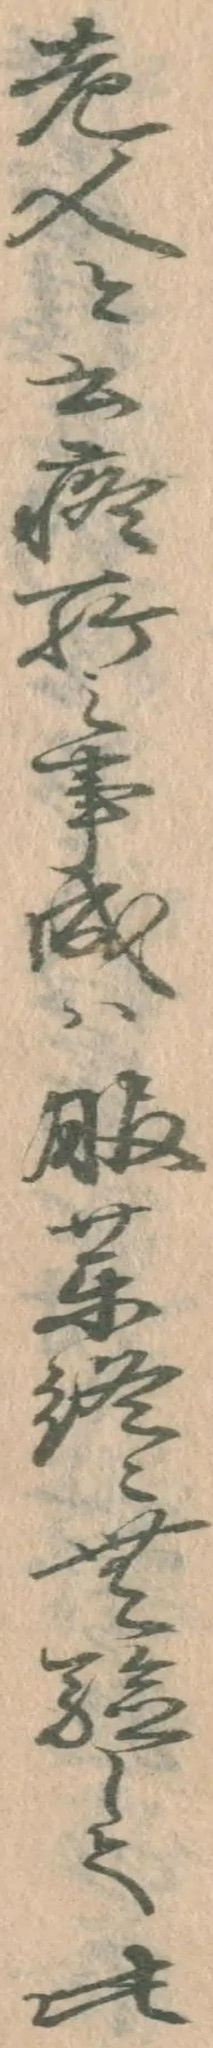老人と云疼所之事成は服薬終に無給して此
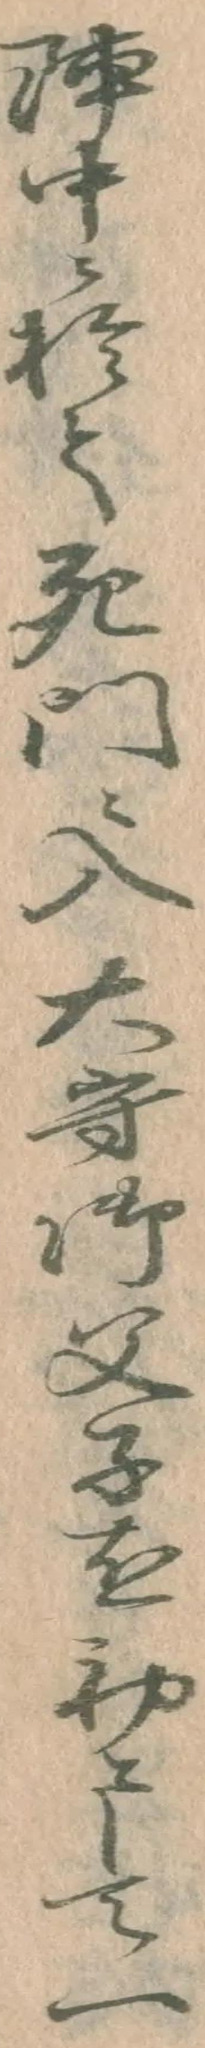陣中に於て死門に入大守御父子を初として一
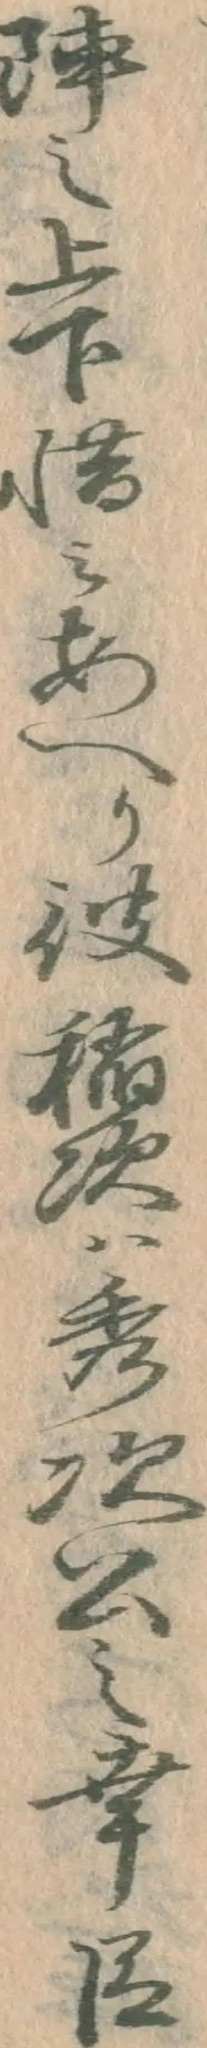陣之上下惜みあへり彼稲次は秀次公之幸臣
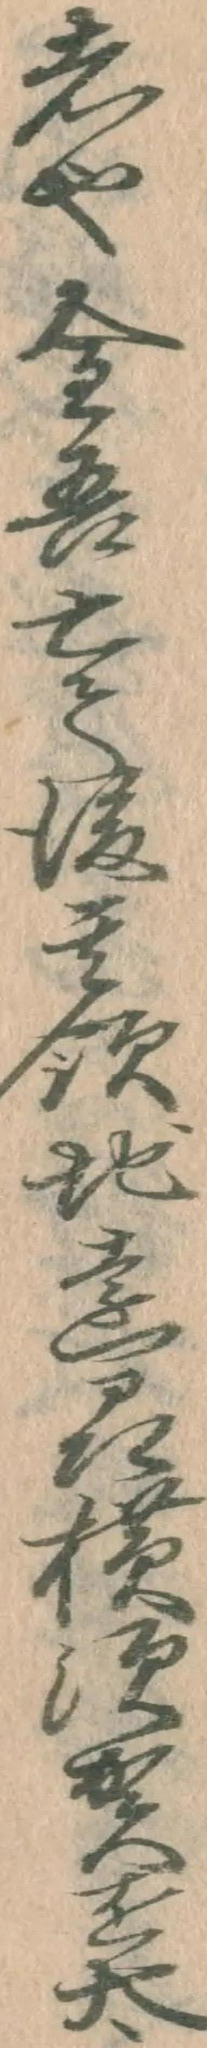者や金吾亡て後其領地遠州横須賀を太
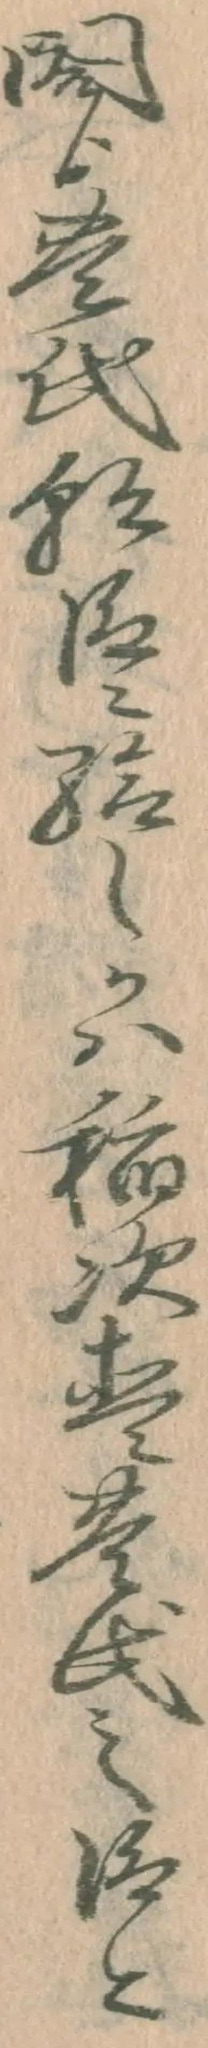閤ゟ豊氏朝臣に給しかは稲次直に豊氏之臣と
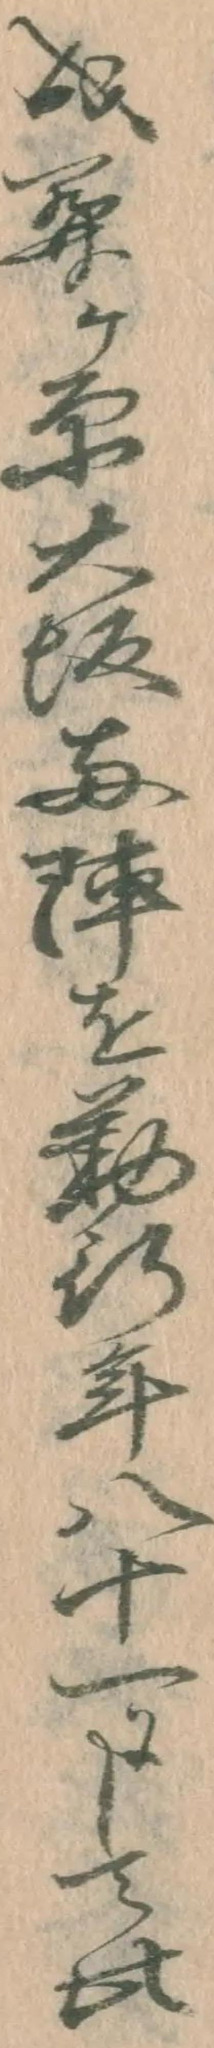成関け原大坂両陣を勤行年八十一尓して此
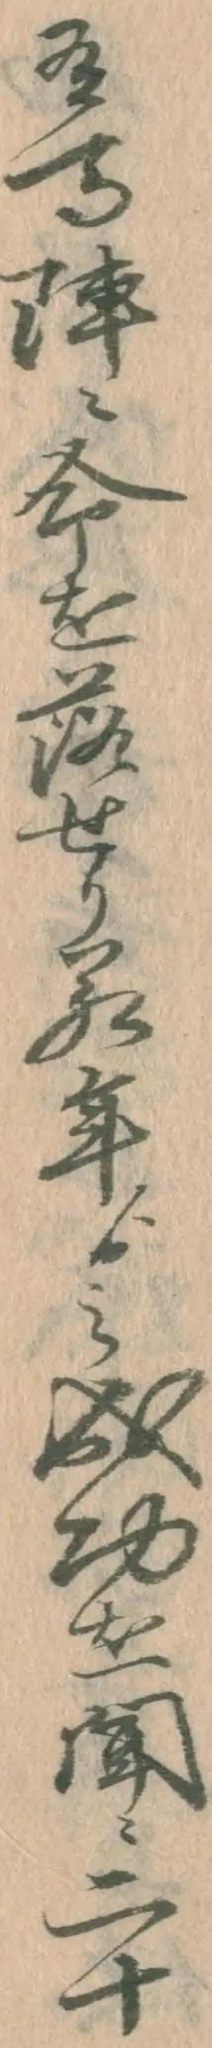有馬陣に命を落せり若年ゟ之成功を聞に二十
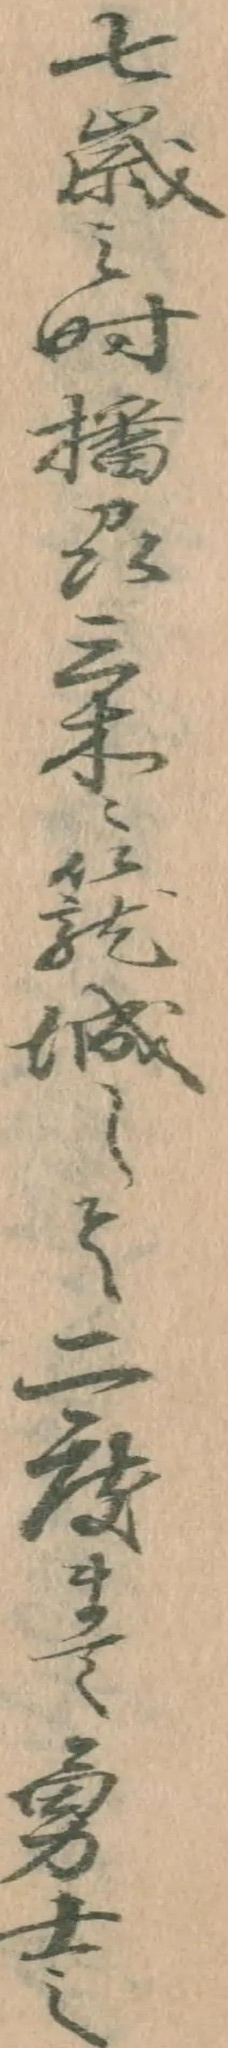七歳之時播州三木に籠城して二度まて勇士之
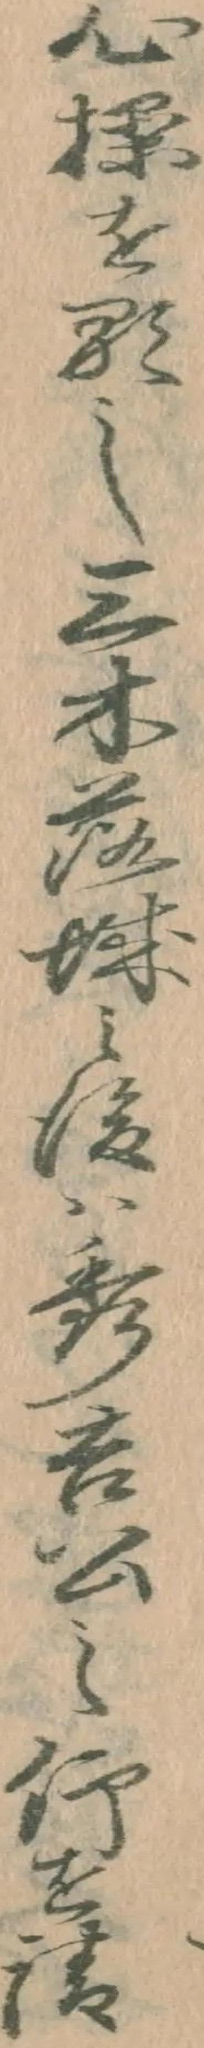心操を顕し三木落城之後は秀吉公之仰を請
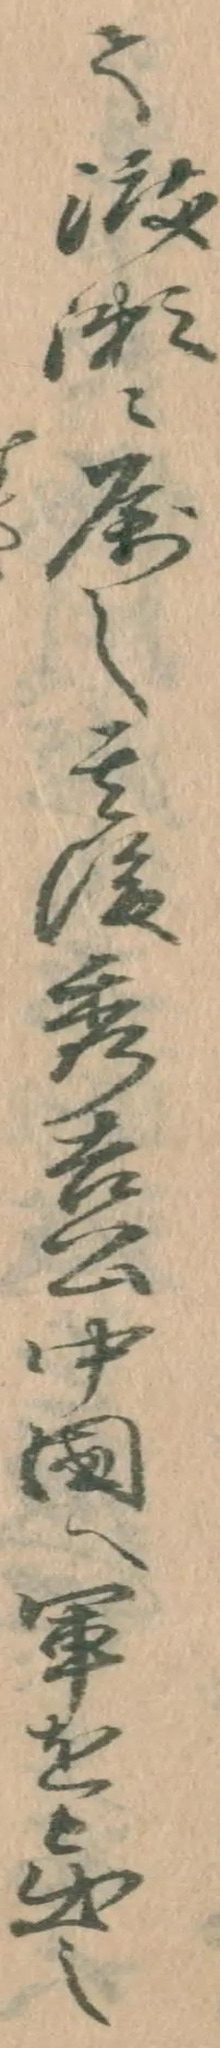て渡瀬に属し其後秀吉公中国へ軍を被出し
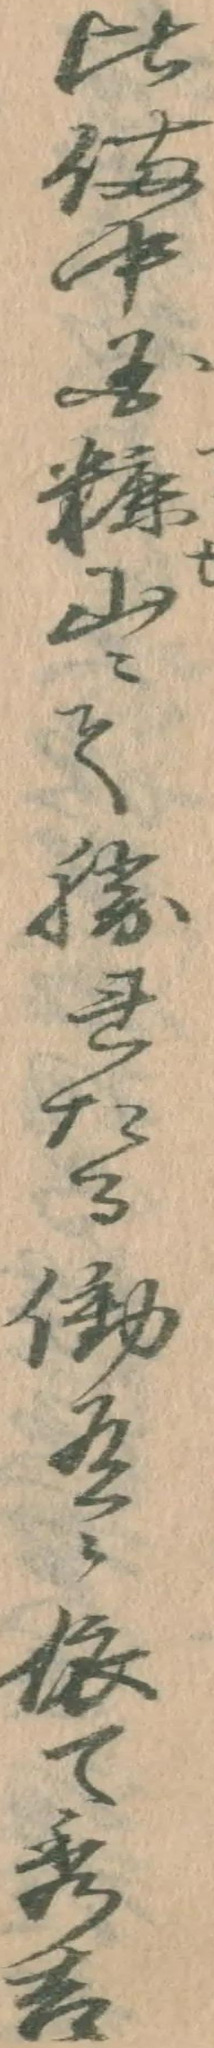比備中国糠山にて勝連たる働有に依て秀吉
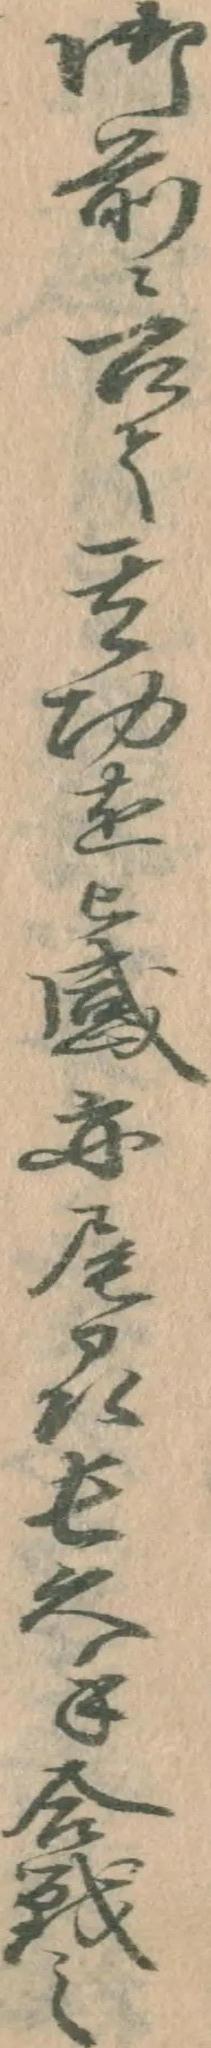御前に召て其功を被感亦尾州長久手合戦之
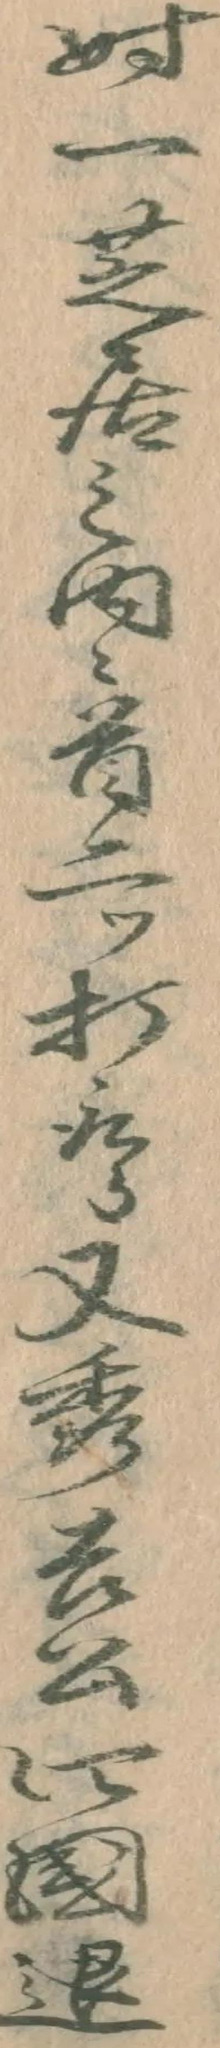時一芝居之内に首二つ打取る又秀吉公四国退
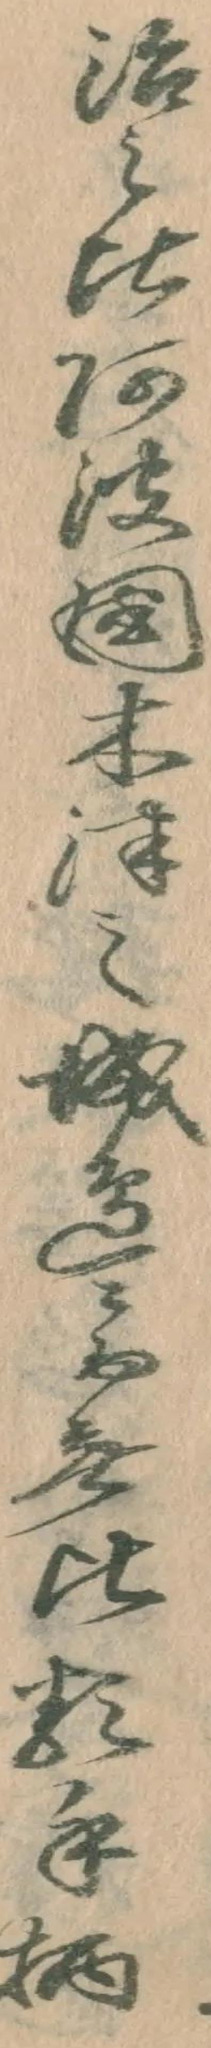治之比阿波国木津之城辺に而無比類手柄
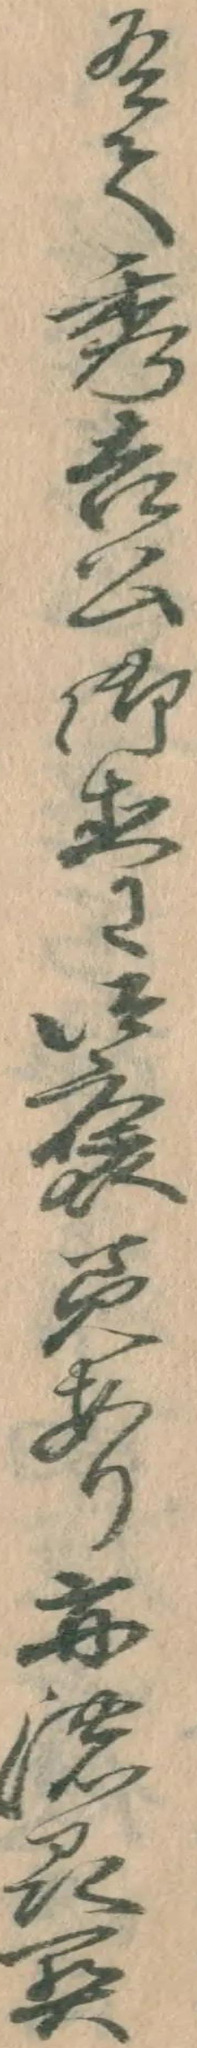有て秀吉公御直尓御褒美あり亦濃州関
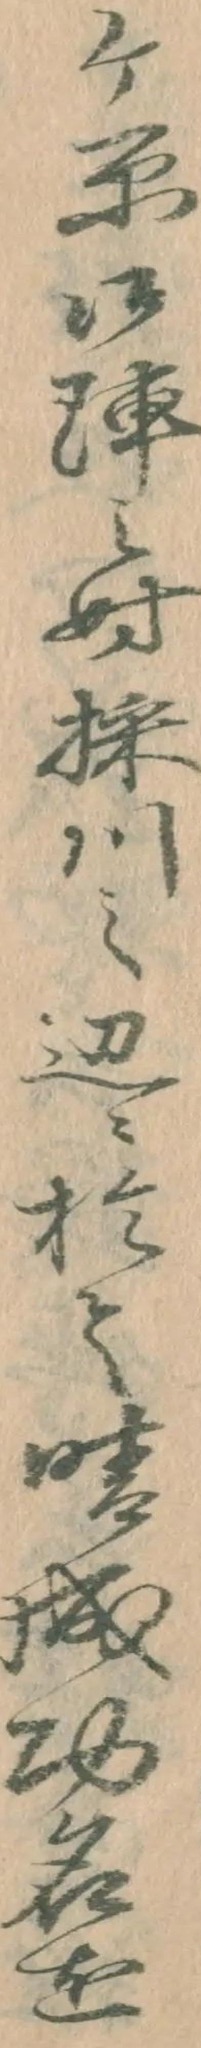け原御陣之時採川之辺に於て晴成功名を
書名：切支丹御退治記 49巻. [5]
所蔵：国立国会図書館 National Diet Library, JAPAN
